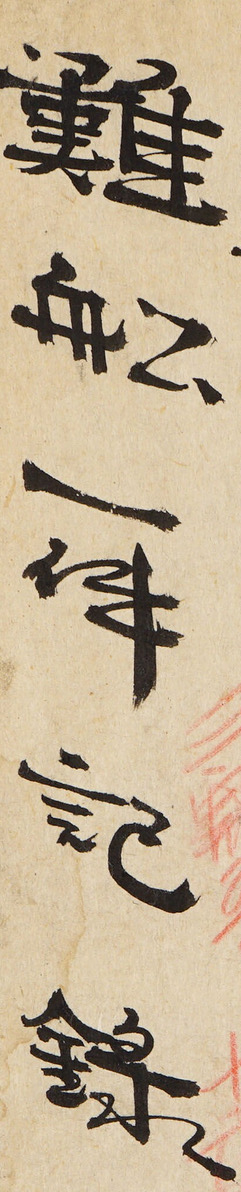難船一件記録

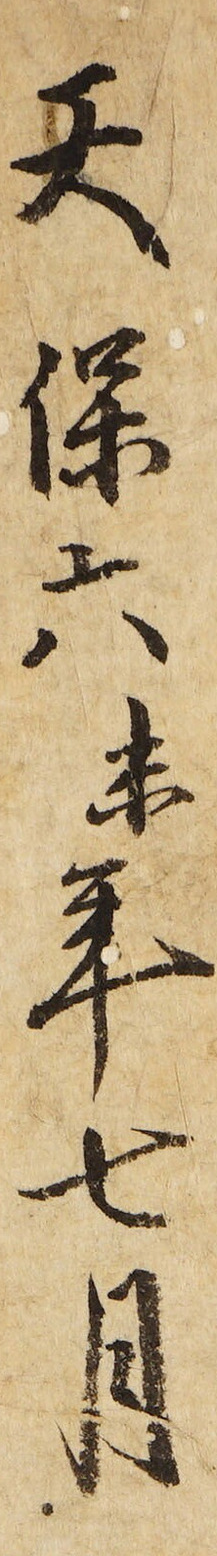天保六未年七月
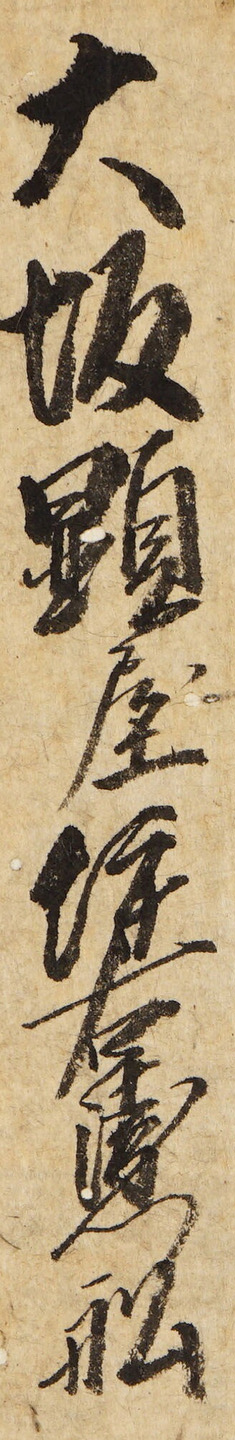大坂顕屋伊右衛門船
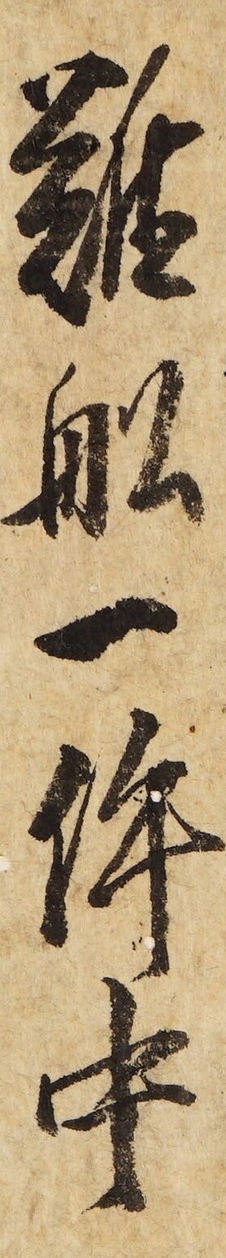難船一件中
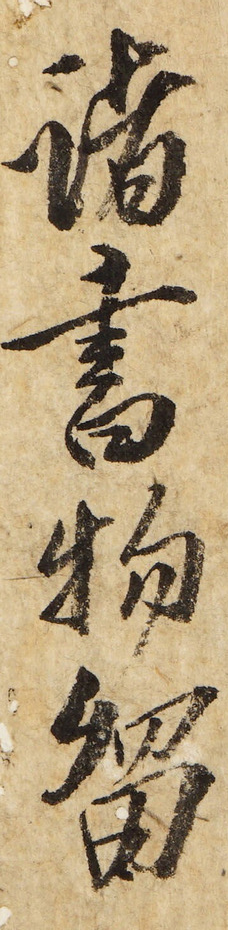諸書物留

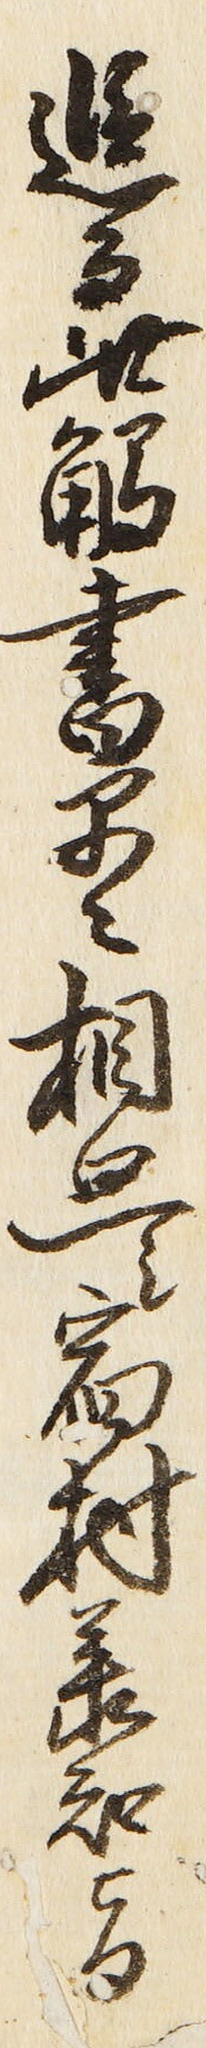追而此触書早々相廻シ宿村承知旨
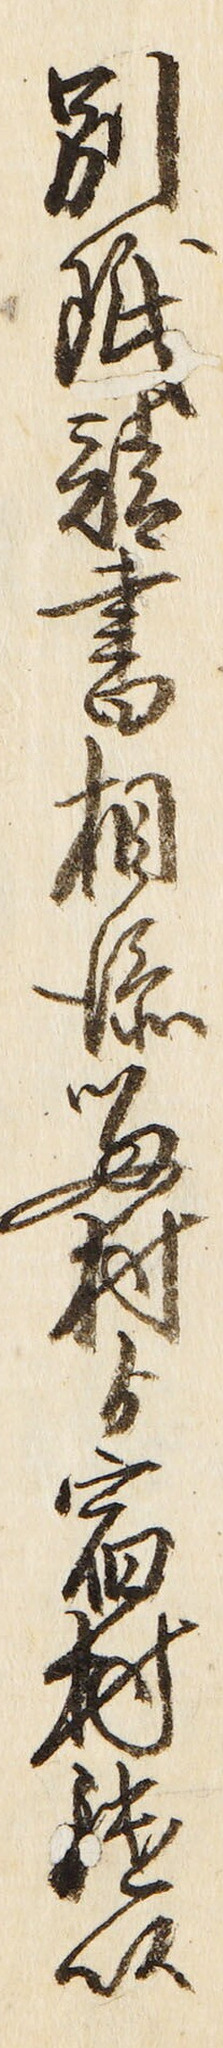別紙請書相添留村ゟ宿村継以
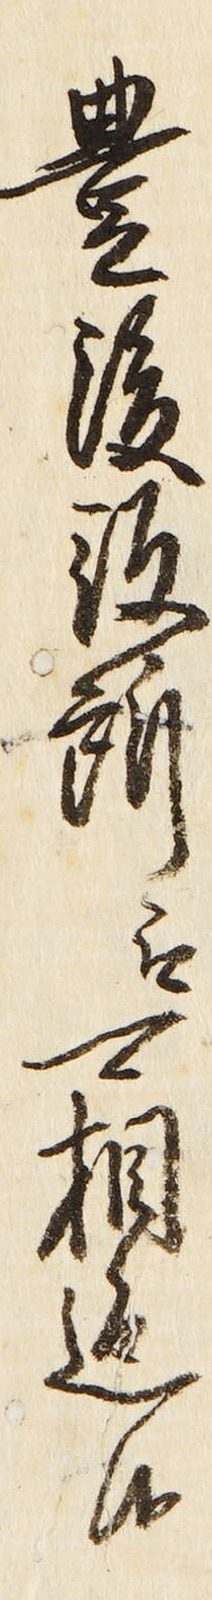豊後役所江可相返候
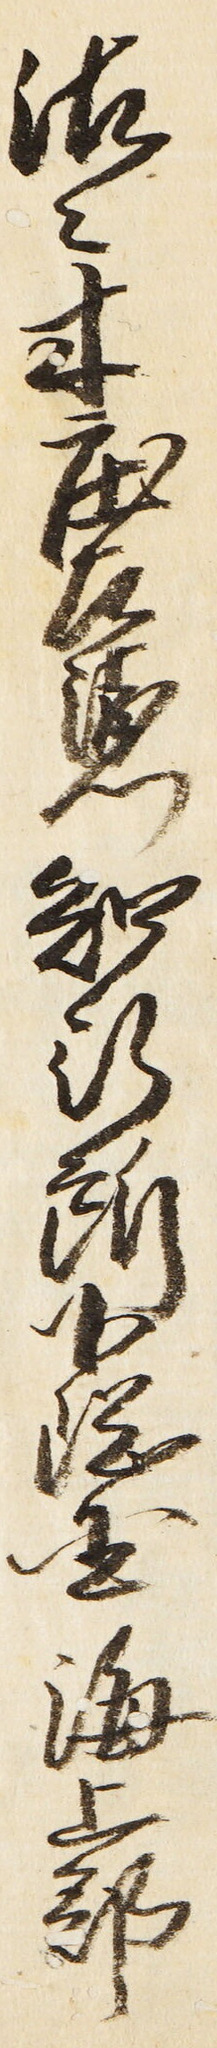佐々木庄左衛門知行所下総国海上郡
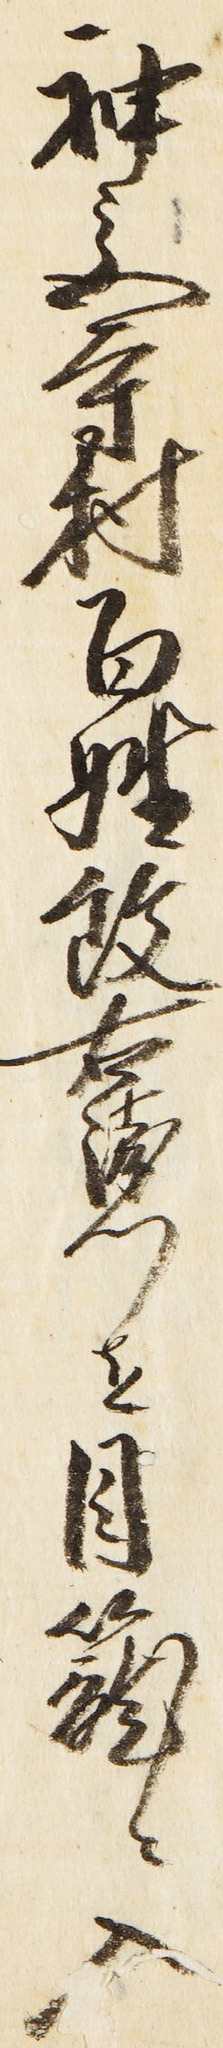神宮寺村百姓政右衛門を目籠ニ入
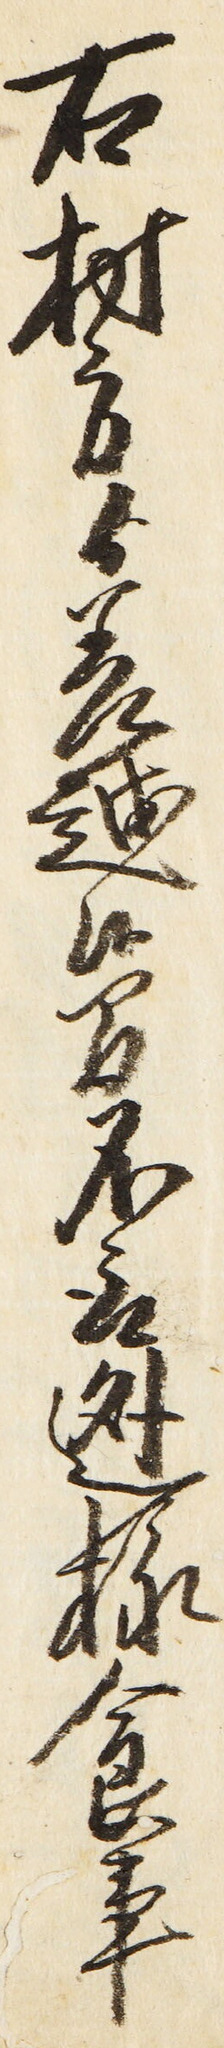右村方ゟ差越候間不取逃様食事
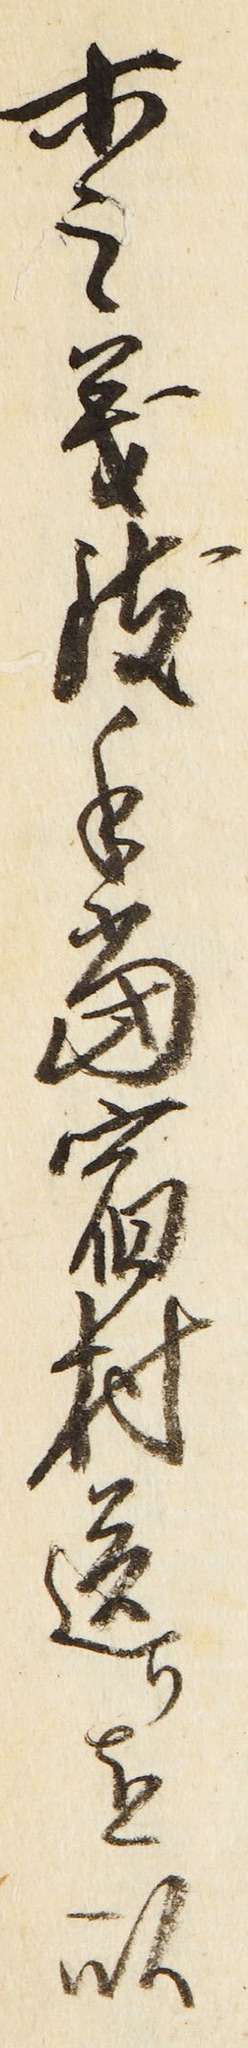等之義致手当宿村送りを以

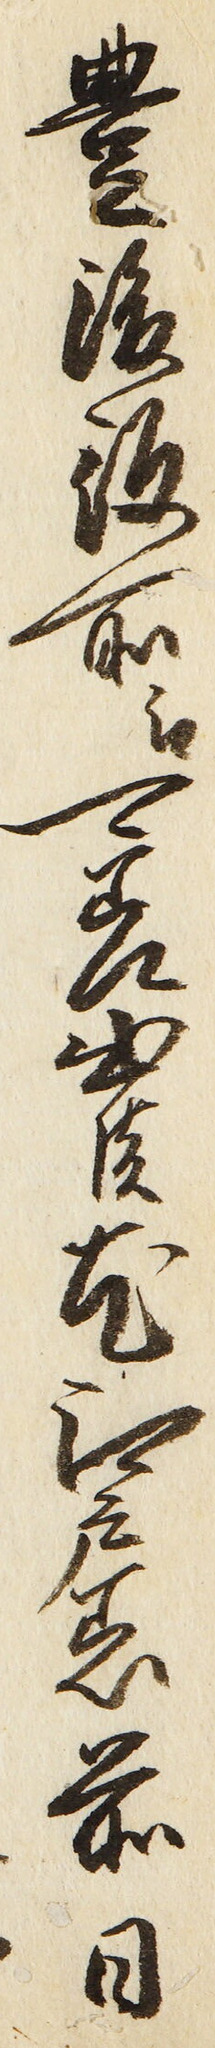豊後役所江可差出候尤江戸表前日
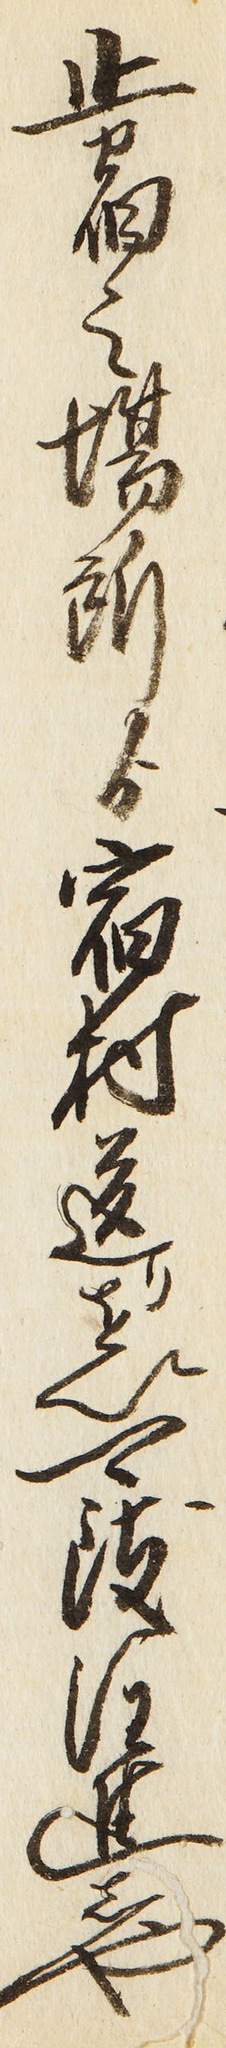止宿之場所ゟ宿村送りを以可注進者也
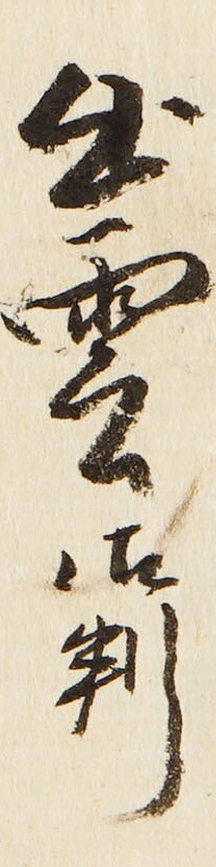出雲御判
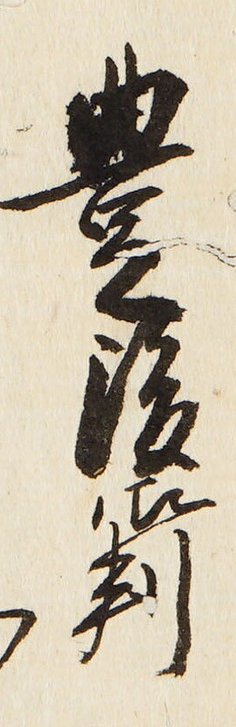豊後御判
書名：難船一件記録
